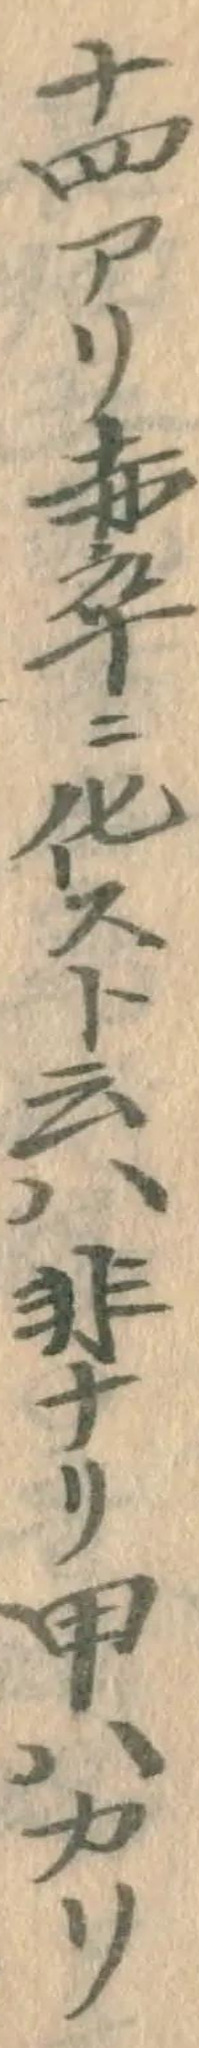十四アリ赤卒ニ化スト云ハ非ナリ甲ハカリ
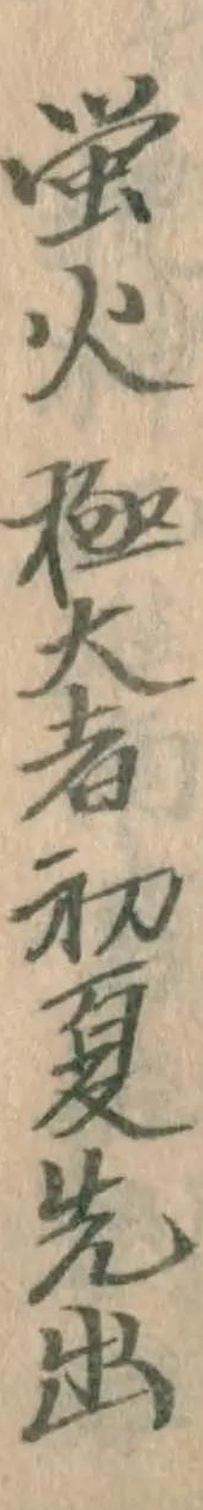蛍火極大者初夏先出
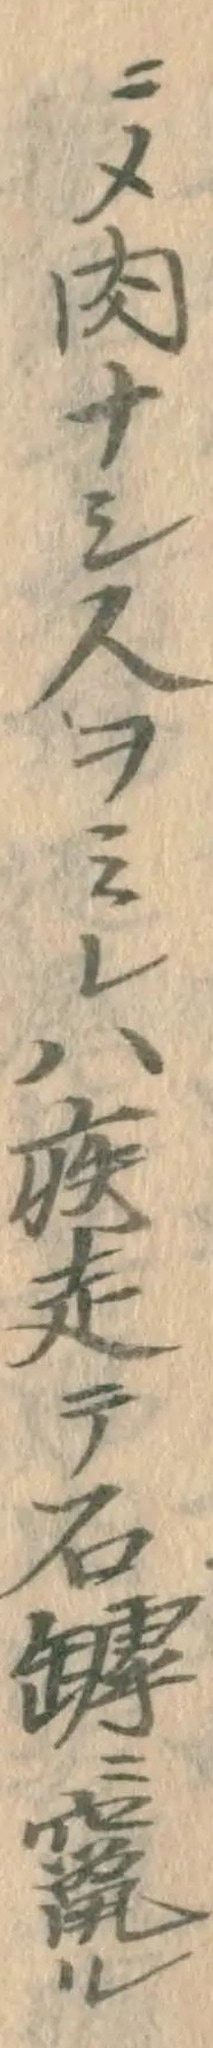ニシテ肉ナシ人ヲミレハ疾走テ石罅ニ竄ル
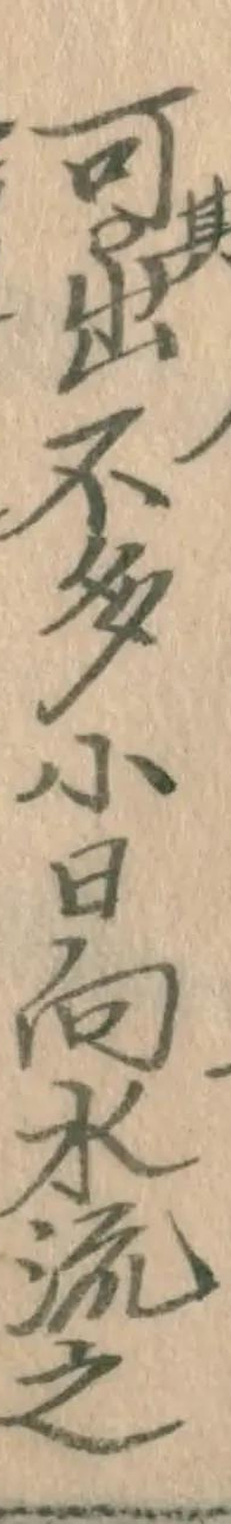可◦出不多小日向水流之
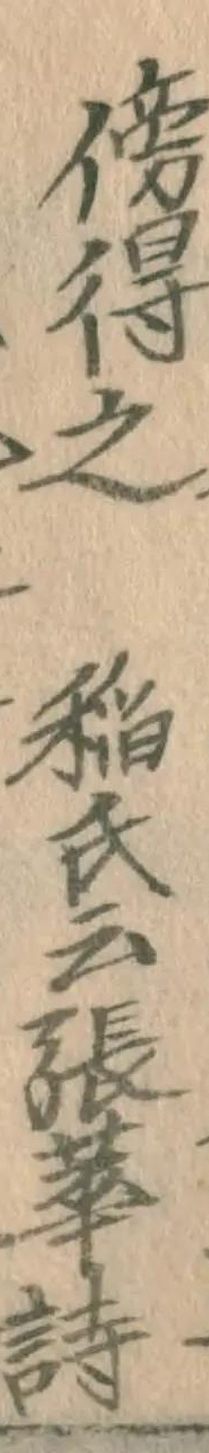傍得之稲氏云張華詩
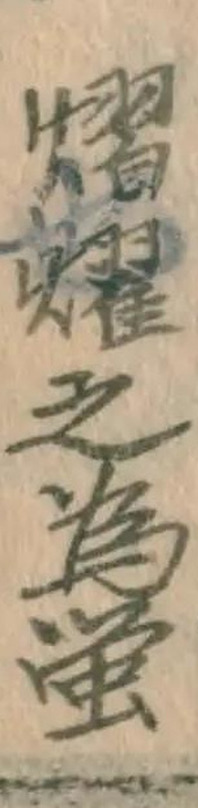熠燿之為蛍
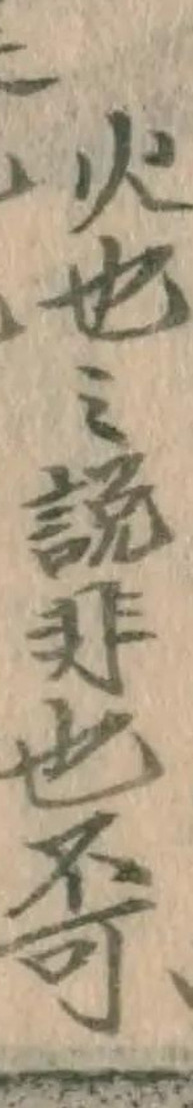火也之説非也不可
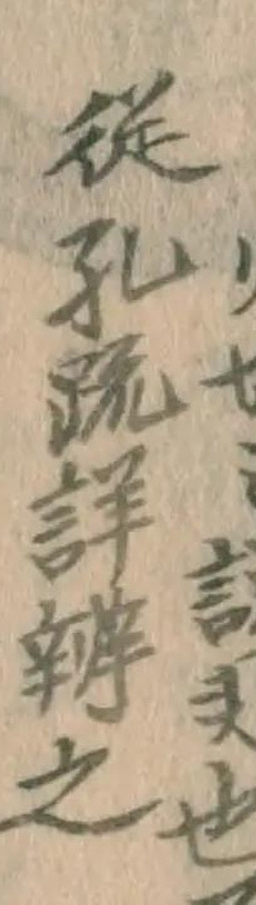従孔䟽詳辨之
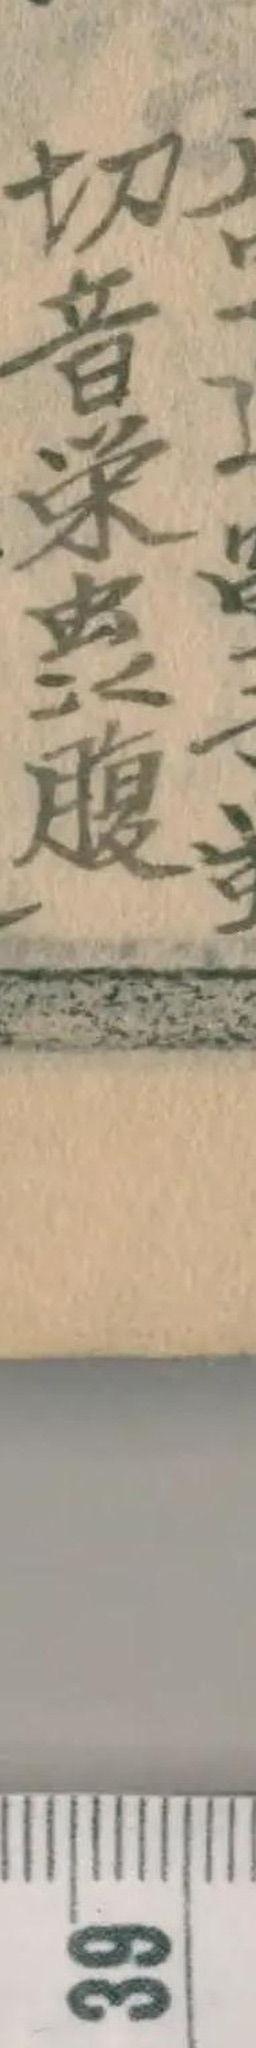切音栄蟲腹
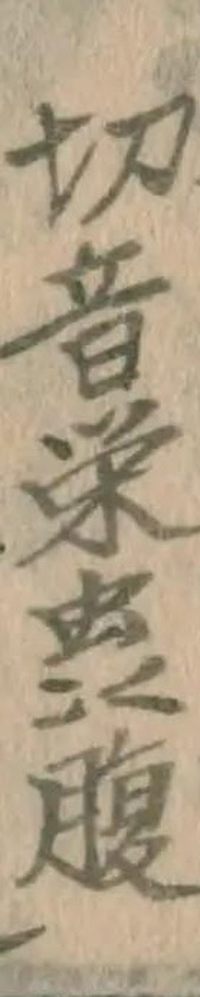切音栄蟲腹
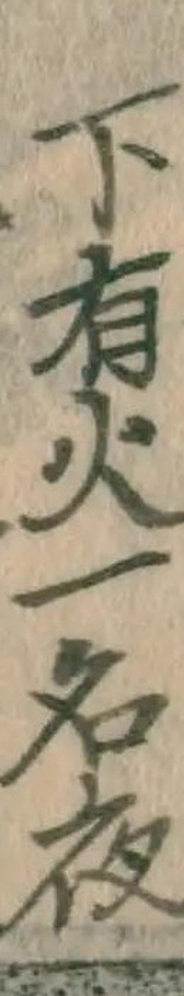下有火一名夜
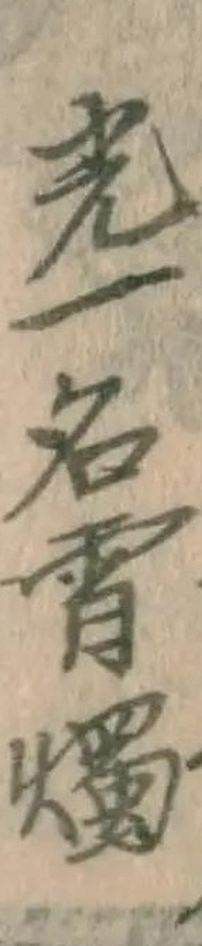光一名霄燭
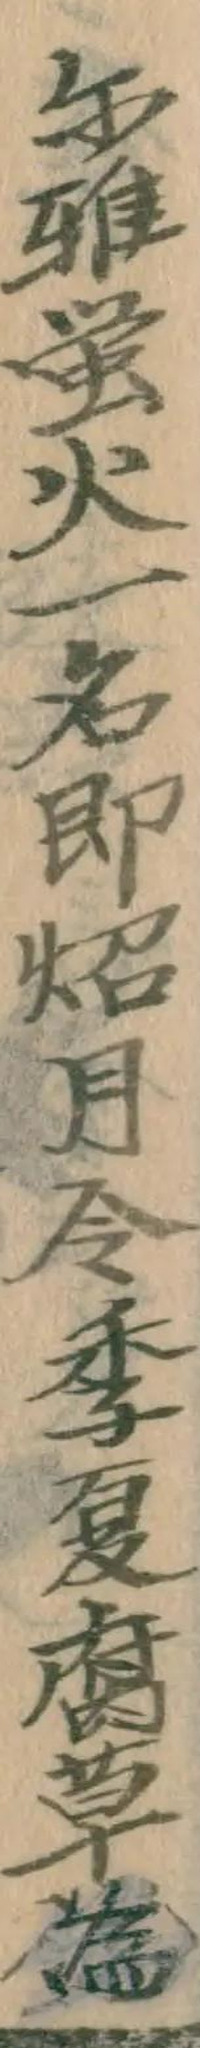尓雅蛍火一名即炤月令季夏腐草為
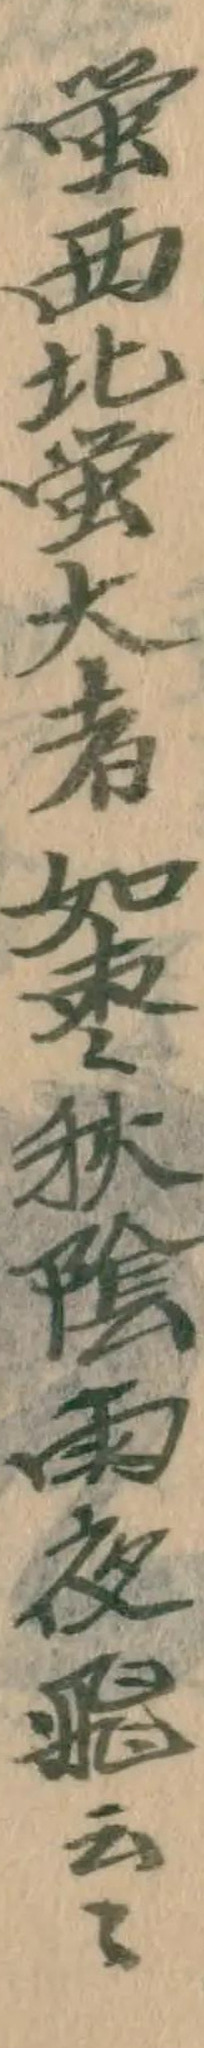蛍西北蛍大者如棗秋陰雨夜飛云々
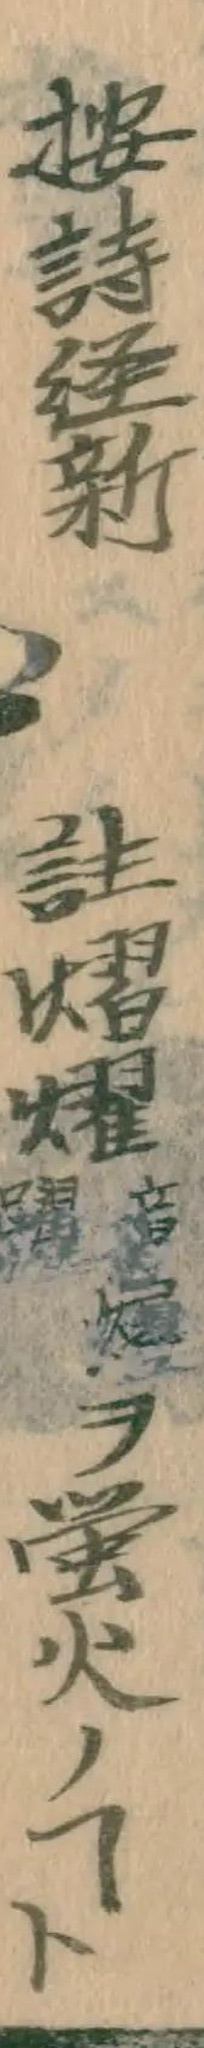按詩経新註熠燿音躍ヲ蛍火ノコトト
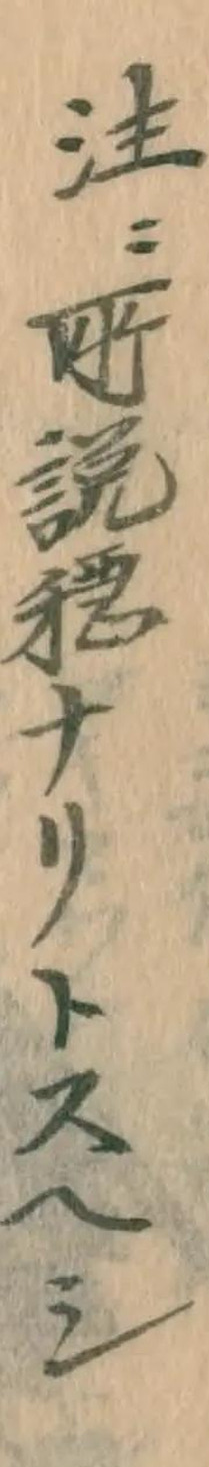注ニ所説穏ナリトスヘシ
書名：千蟲譜 3巻. [2]
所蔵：国立国会図書館 National Diet Library, JAPAN
